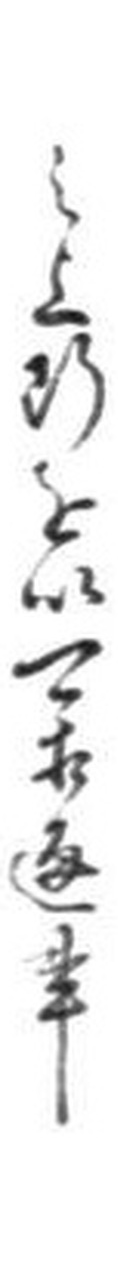之上断を以可相通事
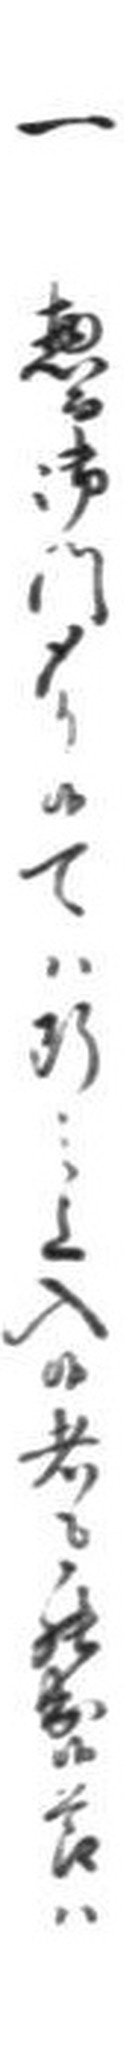一惣而御門〆り候てハ断之上入候者も罷出候節ハ
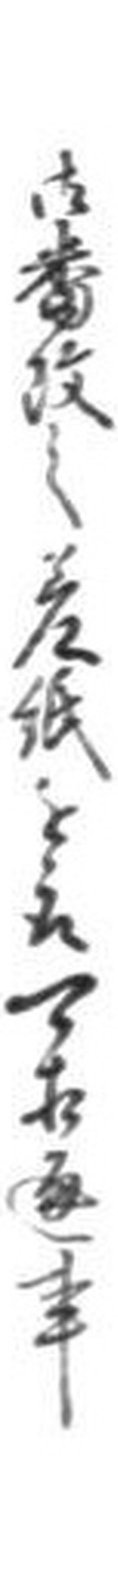御番改之差紙を取可相通事
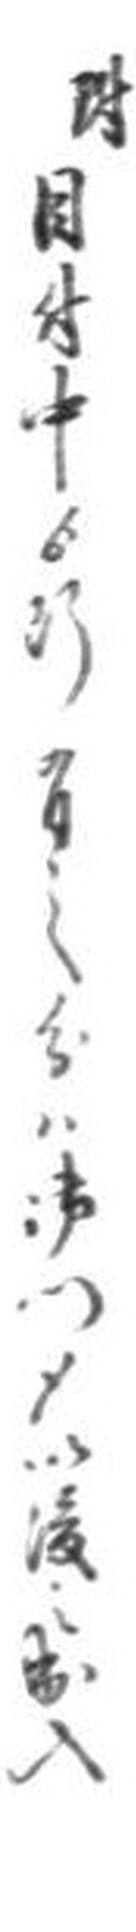目付中ゟ断有之分ハ御門〆以後之出入
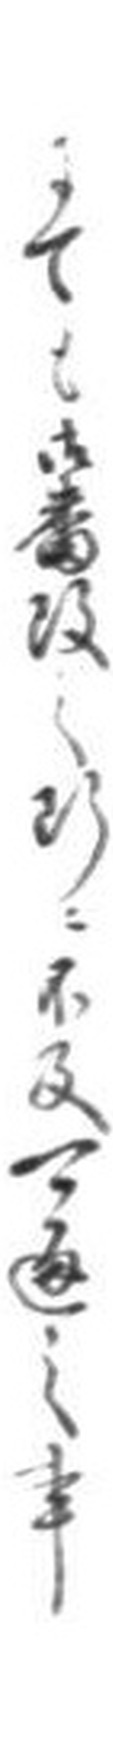にても御番改之断ニ不及可通之事
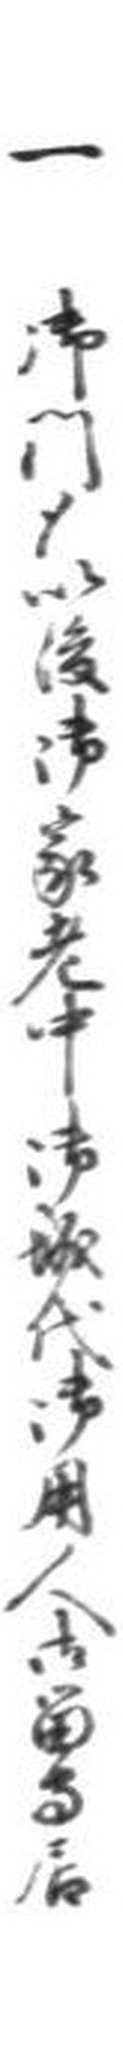一御門〆以後御家老中御城代御用人御留守居
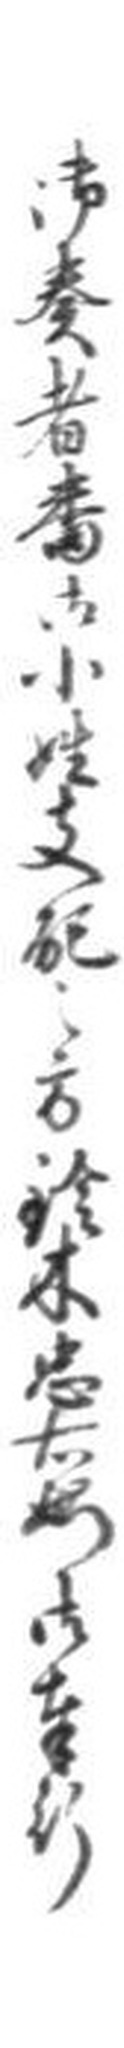御奏者番御小姓支配之方鈴木忠右衛門御奉行
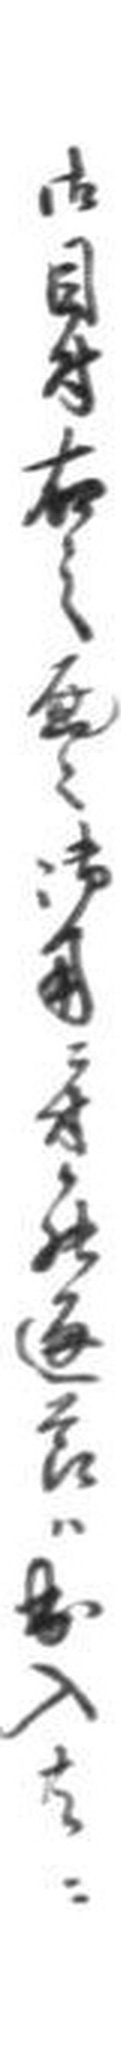御目付右之面々御用ニ付罷通節ハ出入共ニ

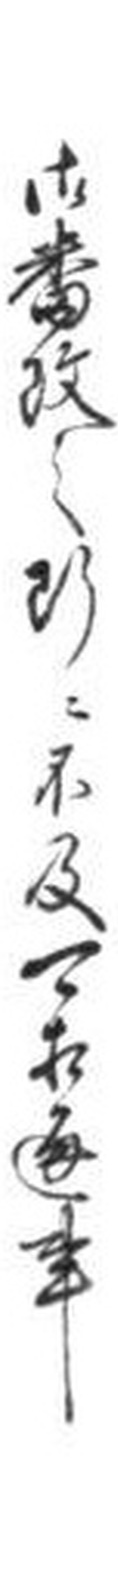御番改之断ニ不及可相通事
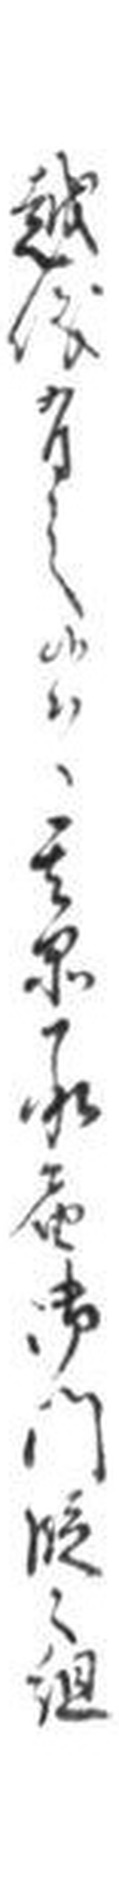越儀有之候ハヽ其品承届御門段々組
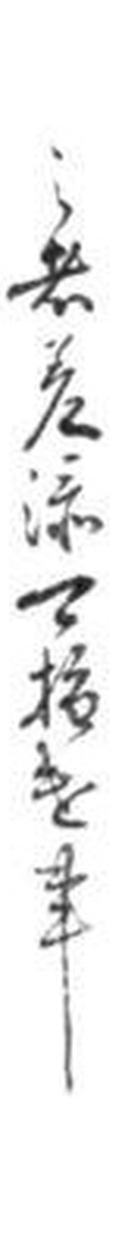之者差添可指遣事
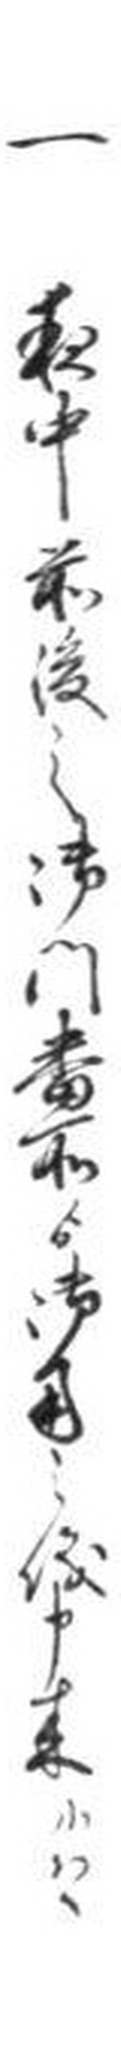一夜中前後之御門番所ゟ御用之儀申来候ハヽ
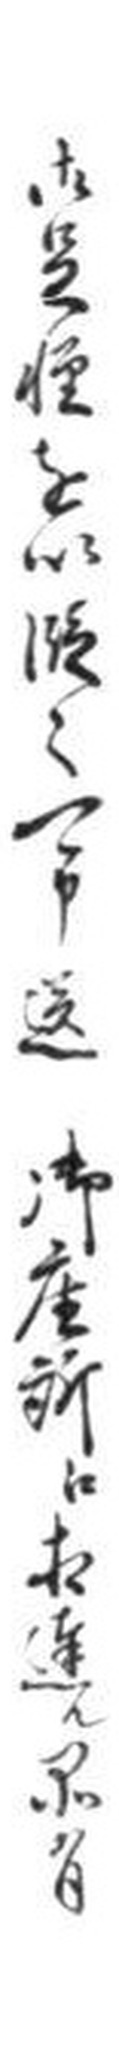御足軽を以段々可申送御座所江相達ル品有
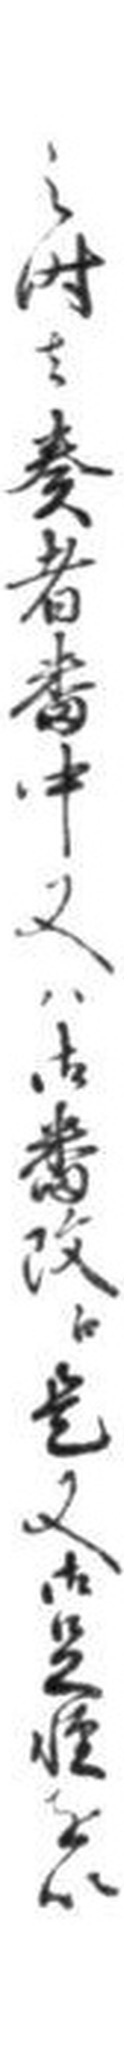之時者奏者番中又ハ御番改江是又御足軽を以
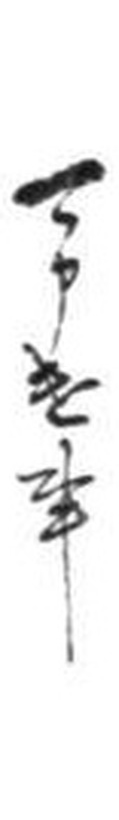可申遣事
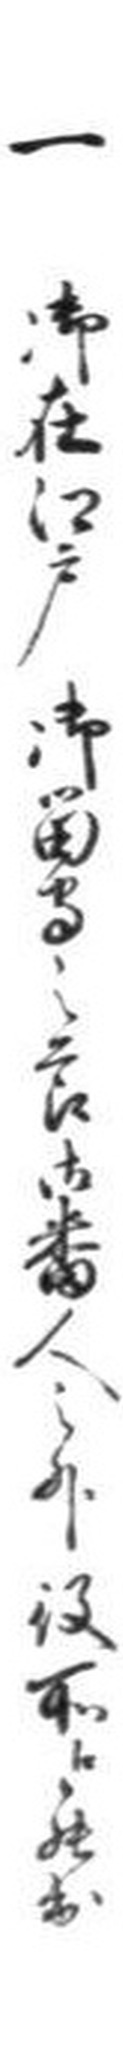一御在江戸御留守之節御番人之外役所江罷出
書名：家譜 三十三 吉邦公 享保四年
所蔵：福井県文書館 Fukui Prefectural Archives
